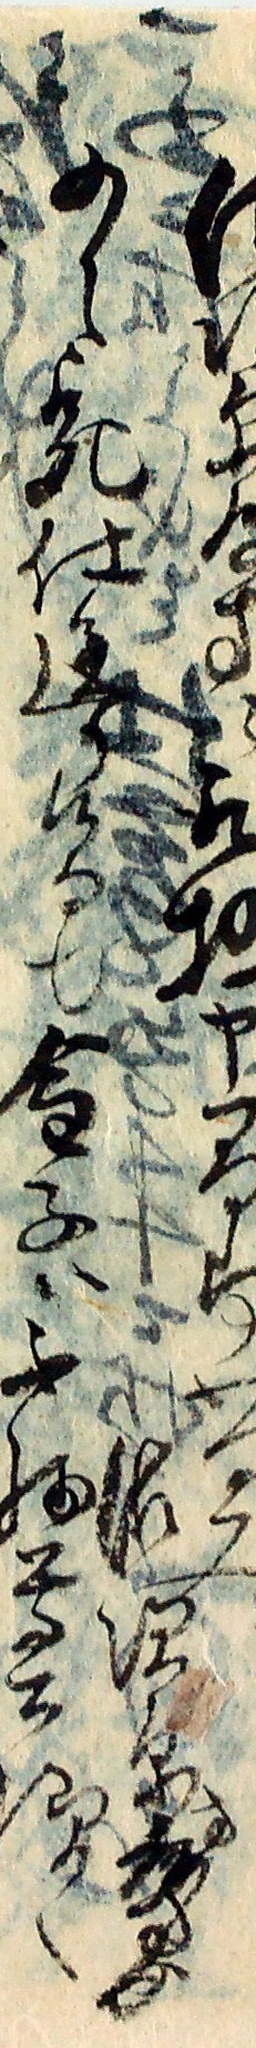のし宛仕送り候ても金子は不残尊公様へ
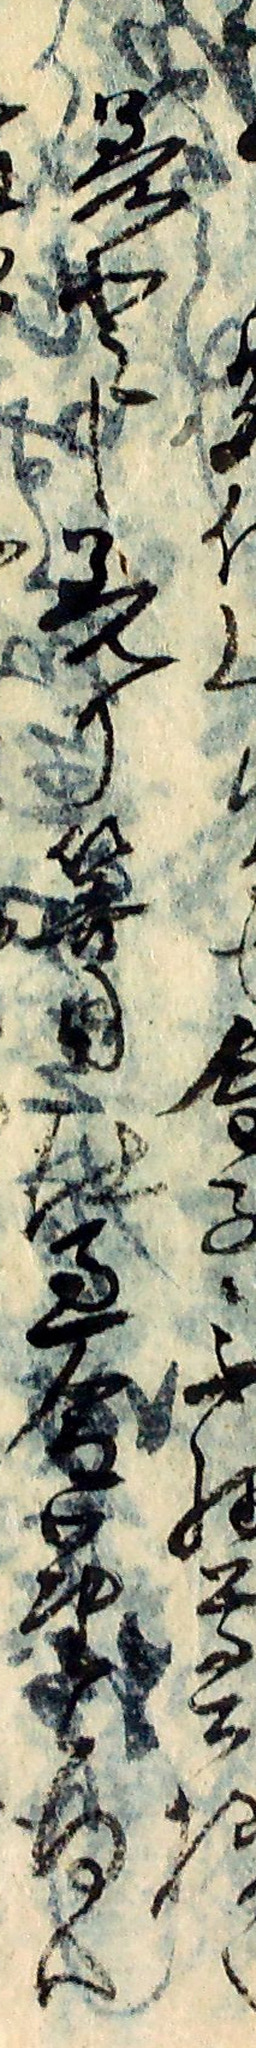差登し差引算用仕過金御座候得は
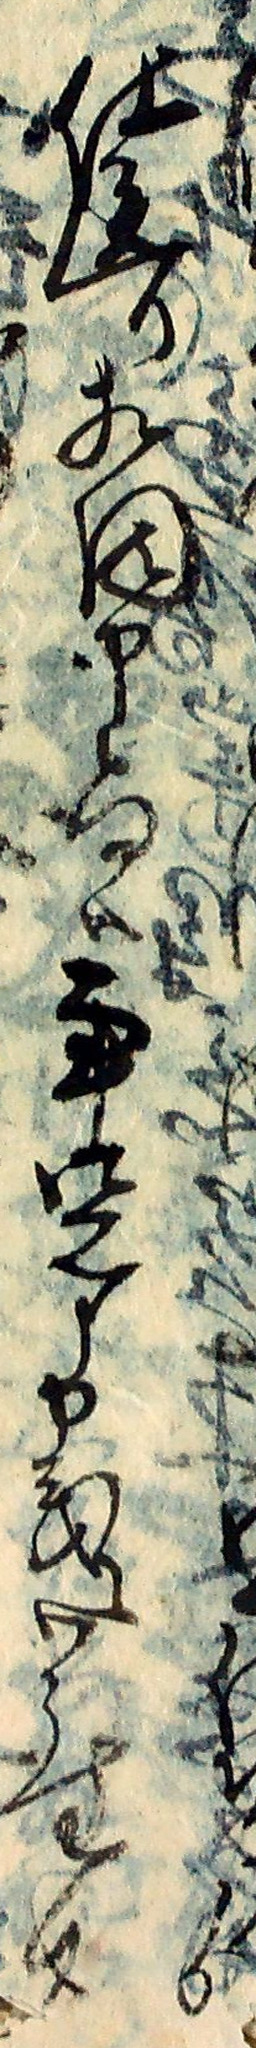仕送り相調申候得は事足り申義に御座候
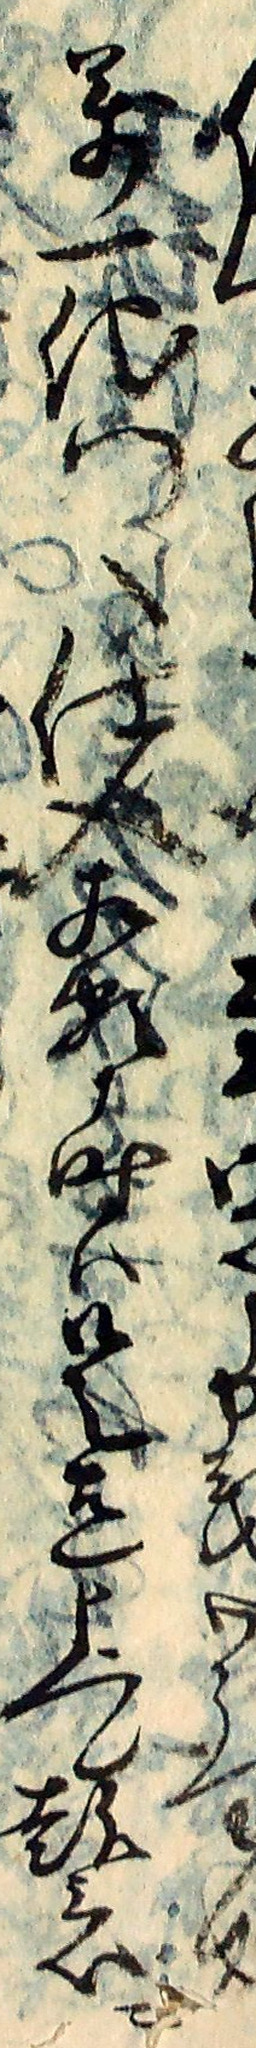万一他門へ仕入相頼候時は是迄申上候趣意に
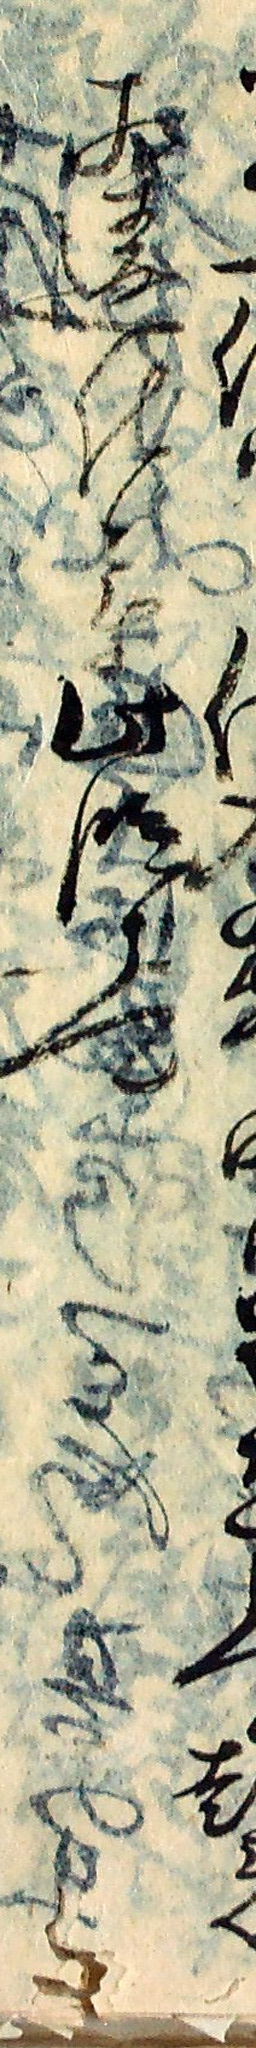相違仕候に付此段申上候
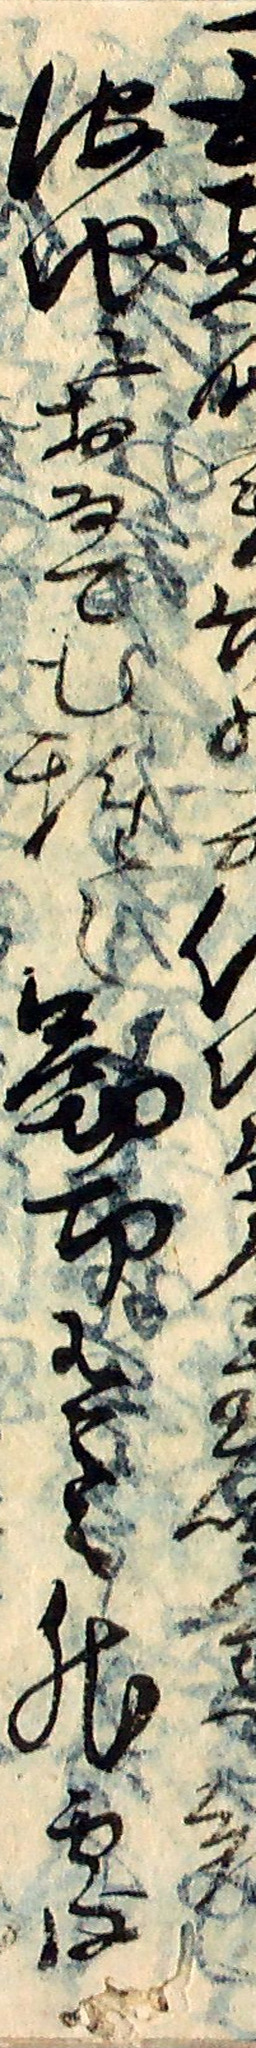彼地におゐても種々勧功有之候然処
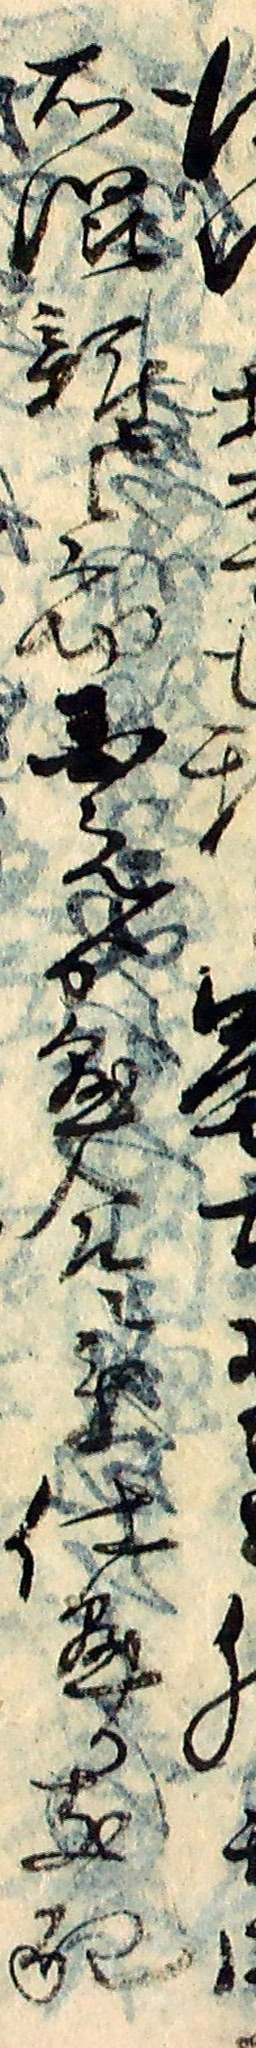右混雑之筋国元ゟ懸合に付仕懸り支配
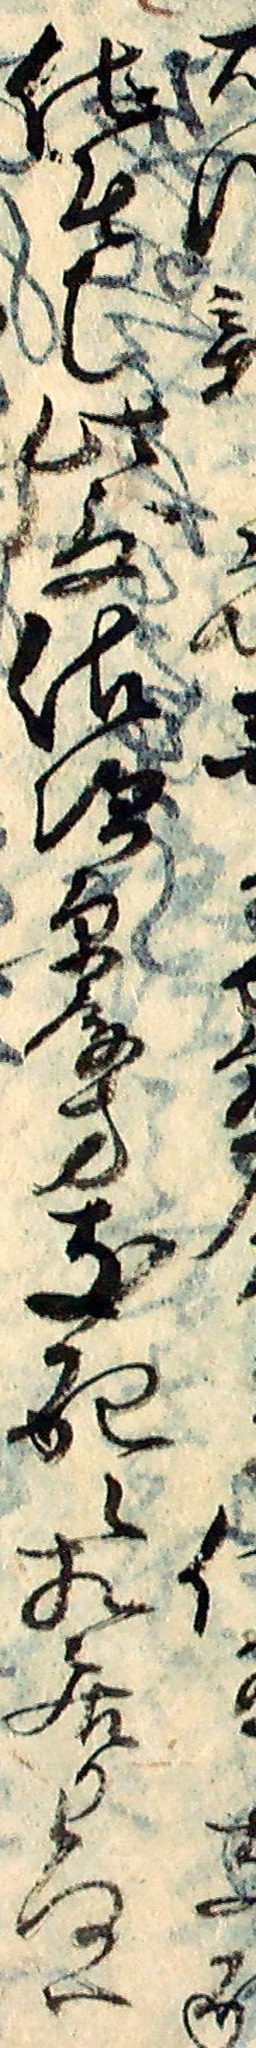他無之此度佐次兵衛殿方支配に相居り候得は
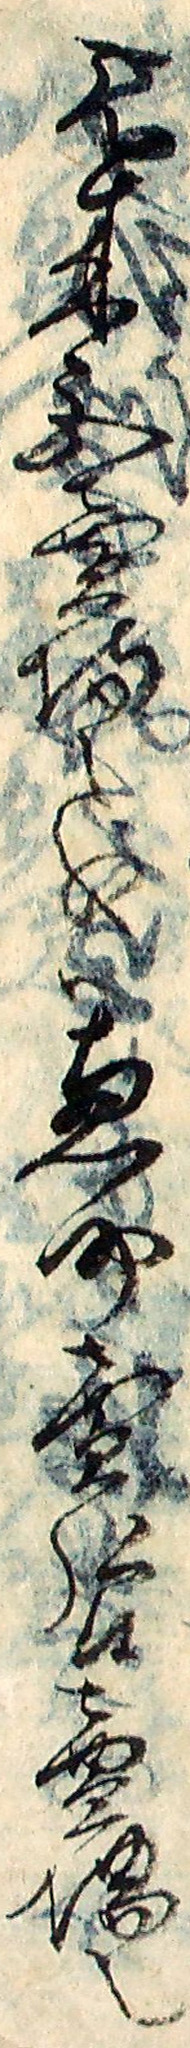本来宮売場之義は恵助売弘候売場之

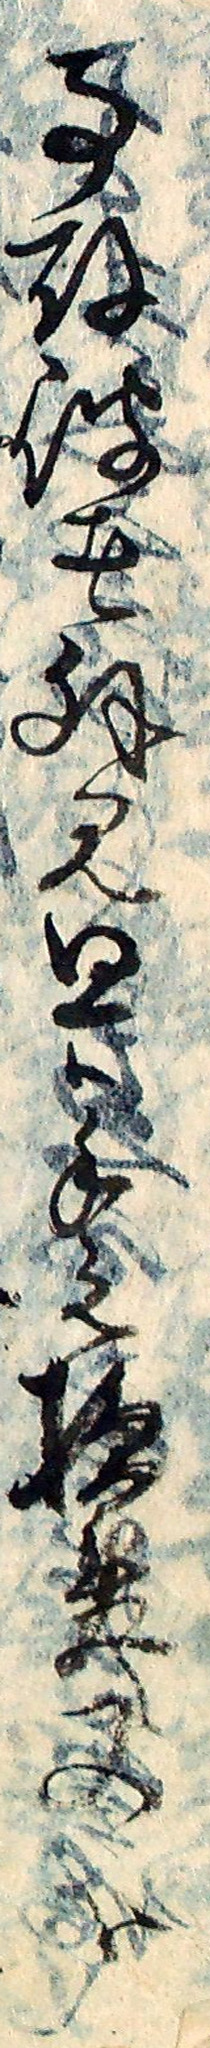事故彼者拝見且は手元損失又は
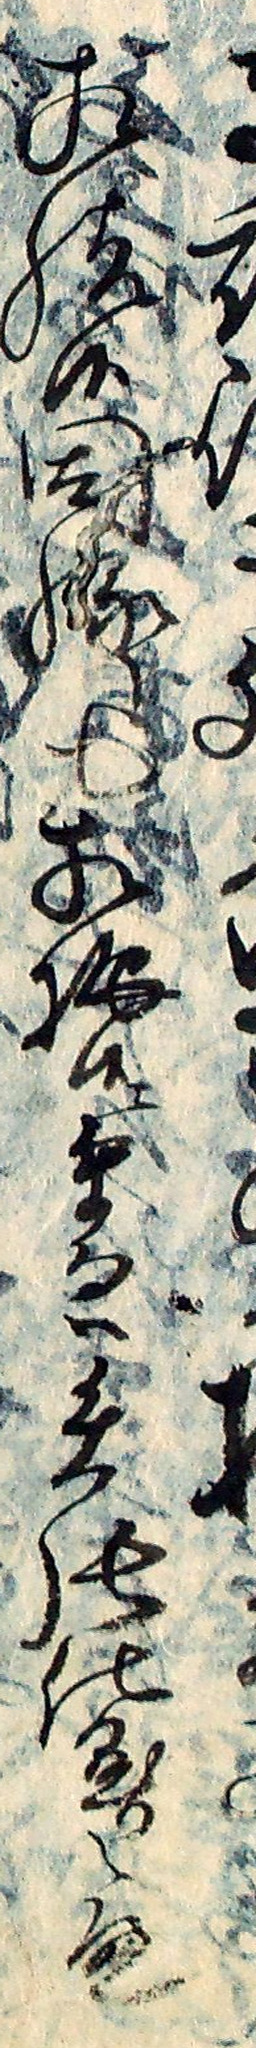相続候因縁にも相拠候に付ては矢張仕懸り之通
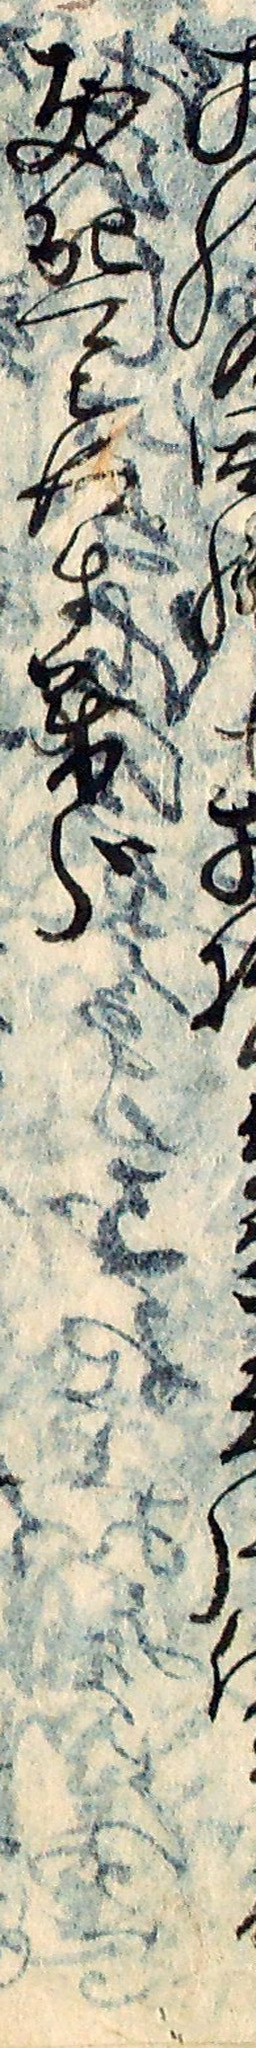支配可被仰付義哉
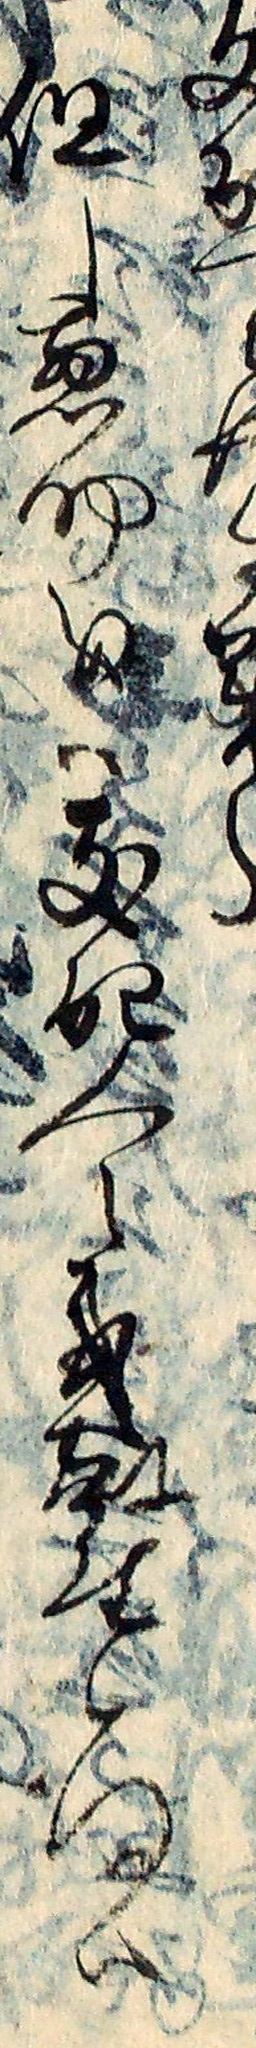但し恵助義支配人之義御座候得は
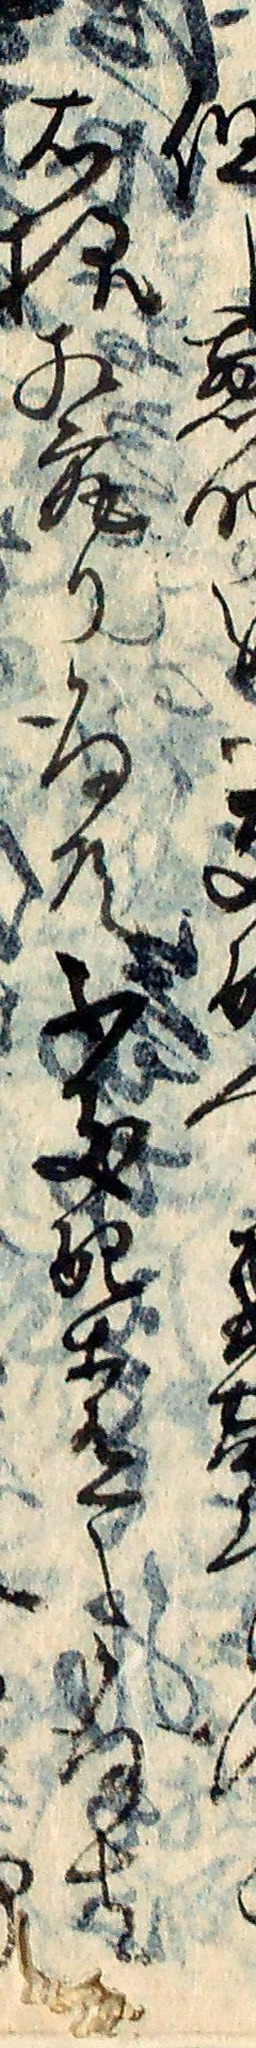右様相究り候得共不支配等有之候得は
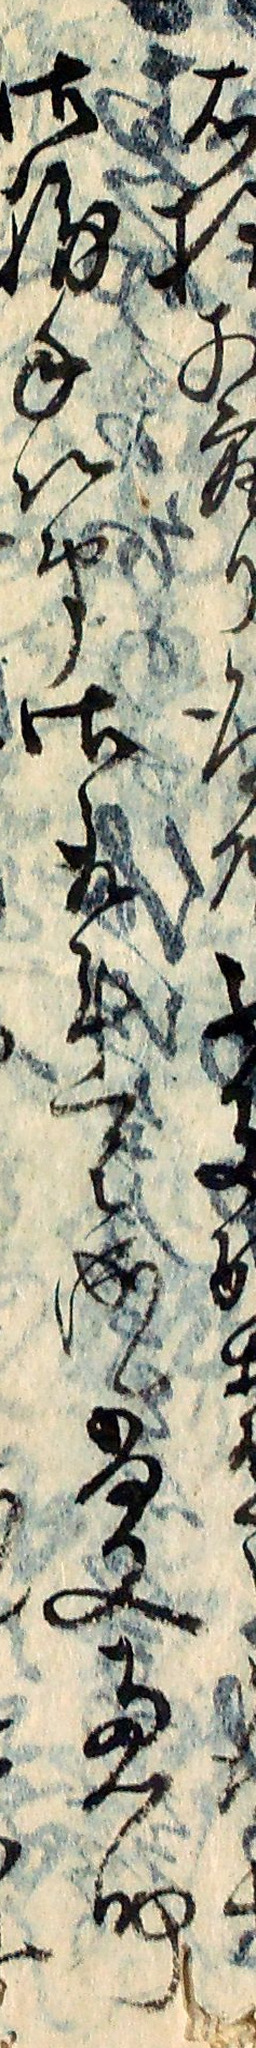御勝手次第御取計可被成候尚又恵助
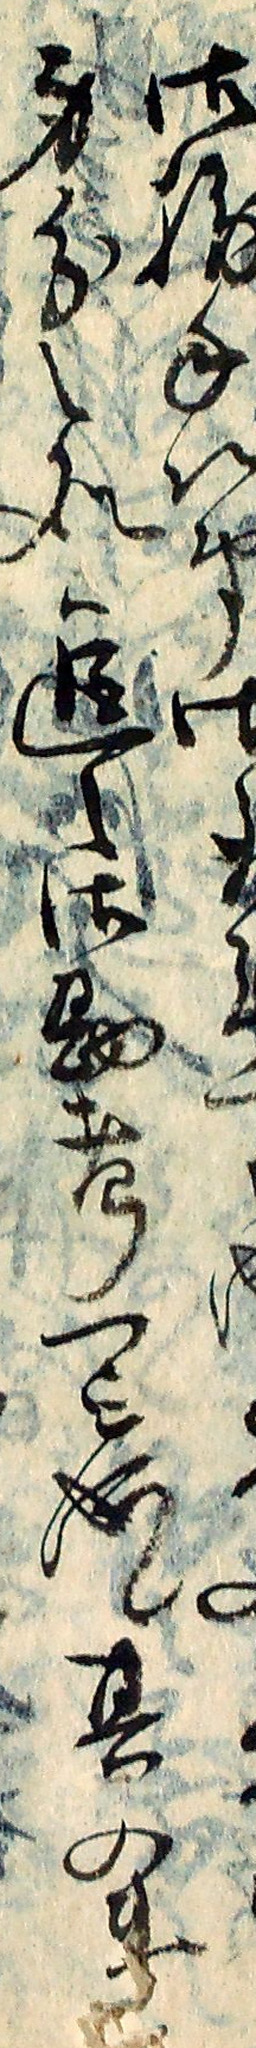身分之処は追々御勘考可被成候其余
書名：諸御願書控(後藤氏壱番）
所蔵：鳴門教育大学 Naruto University of Education
